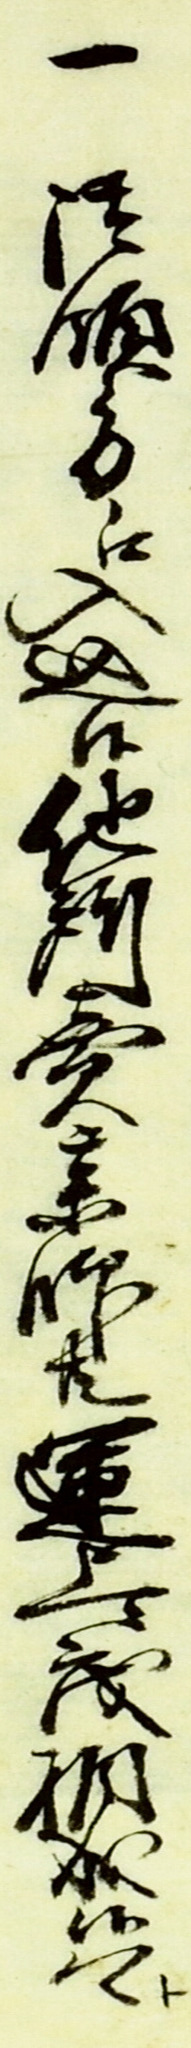一御領分方江入込候他所売薬師共運上ニ茂相成候ハヽト
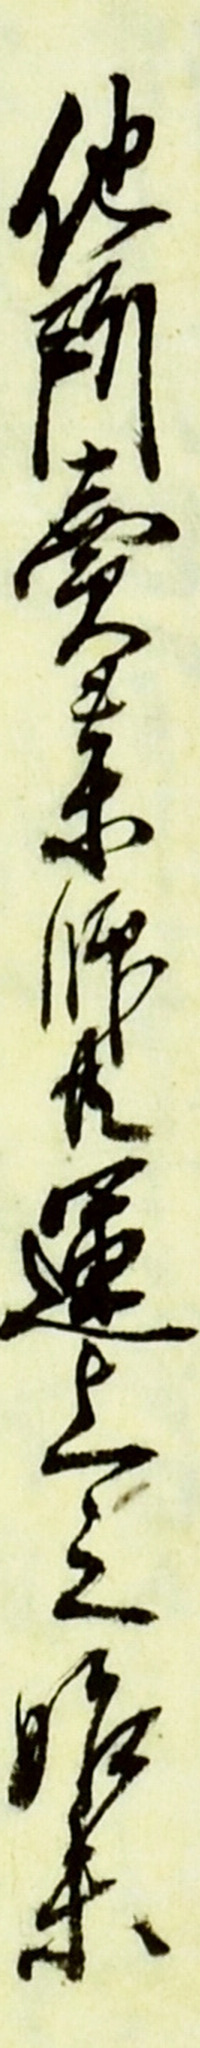他所売薬師共運上之始末
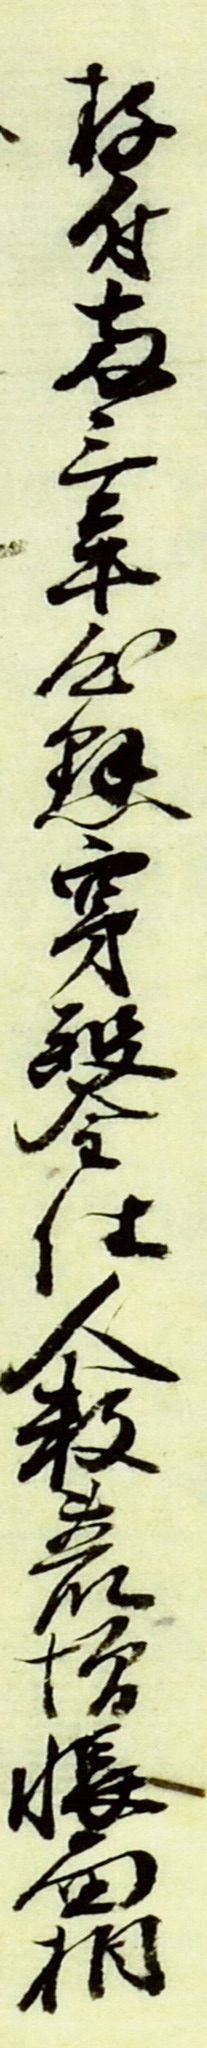存付両三年心懸穿鑿四仕人数荒増帳面相
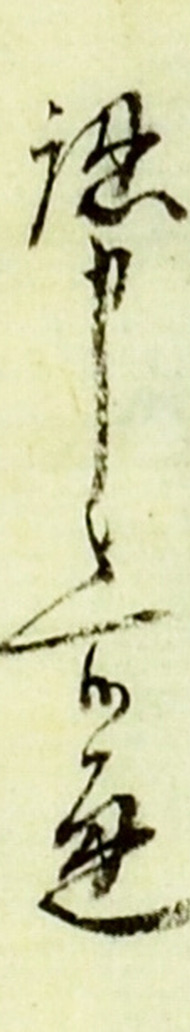認申上候通
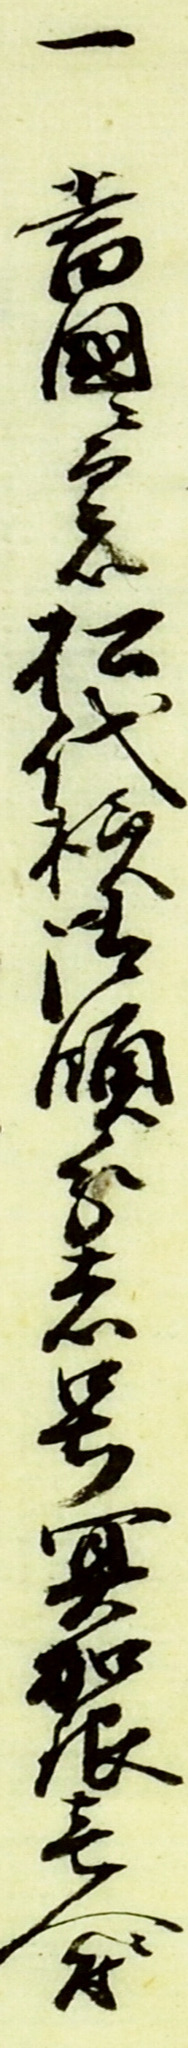一当国ニ而者松代様御領分者号冥加帳壱人茂
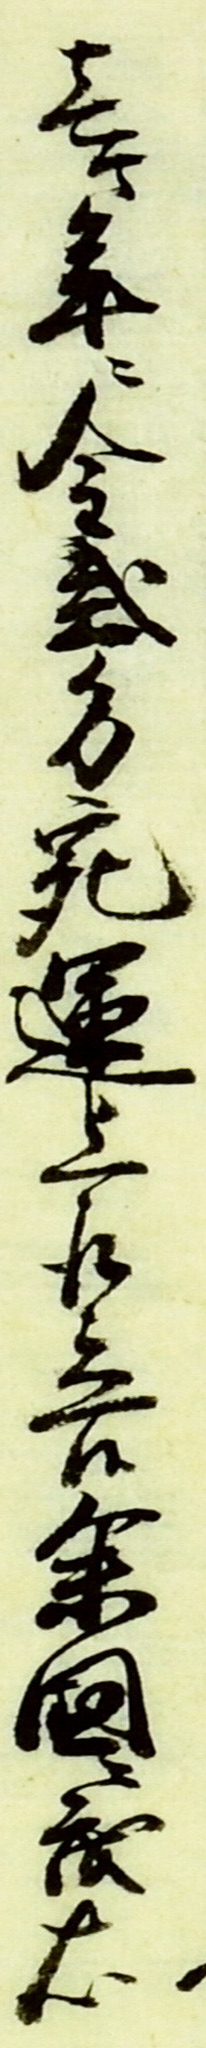壱ヶ年ニ金裁方宛運上取立候余国ニ茂右
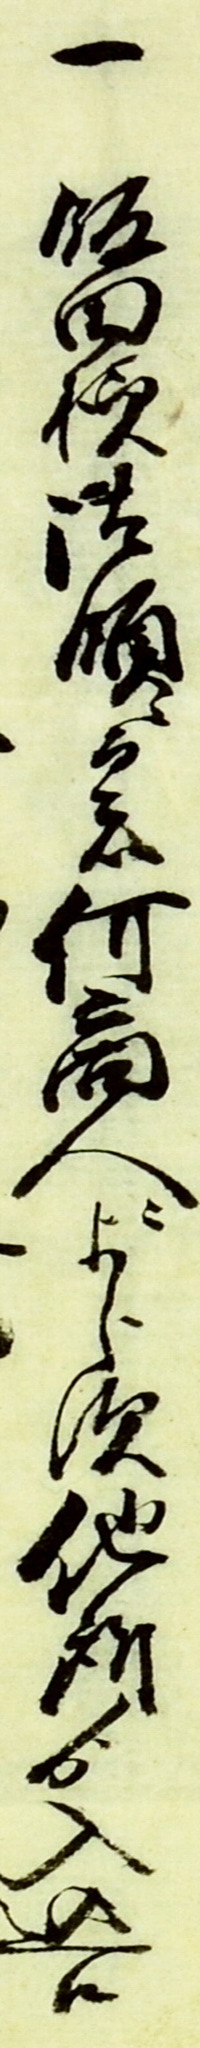一飯田様御領ニ而者何商人ニよらす他所ゟ入込候
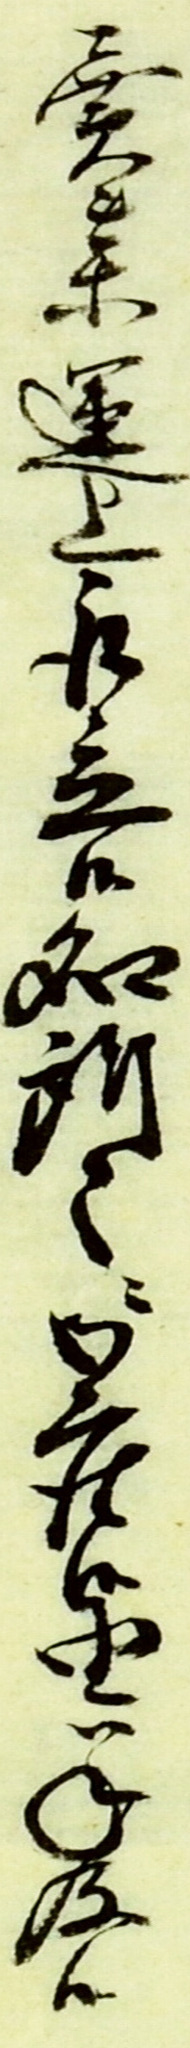売薬運上取立候処所々ニ御座候由承及候
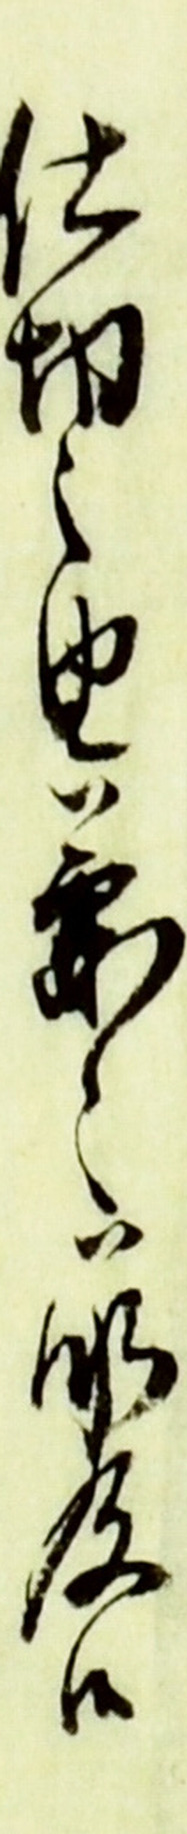仕切之由兼々承及候
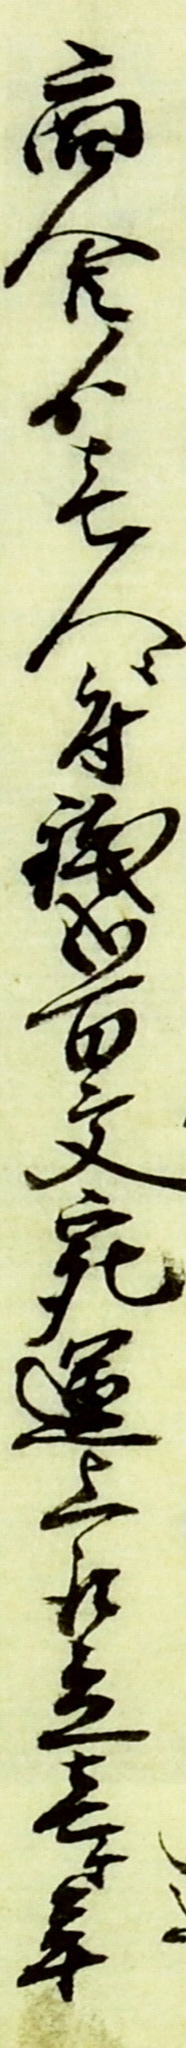商人共ゟ壱人ニ付銭弐百文宛運上取立壱ヶ年
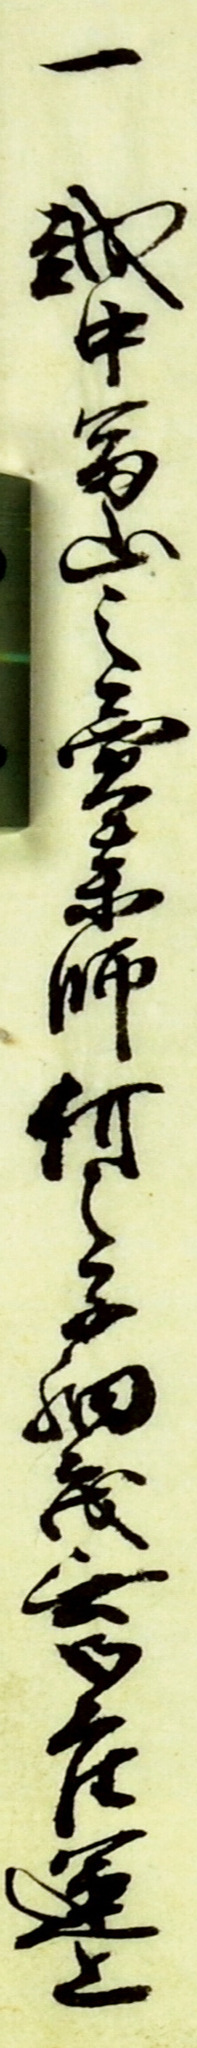一越中冨山之売薬師何之子細茂無御座運上

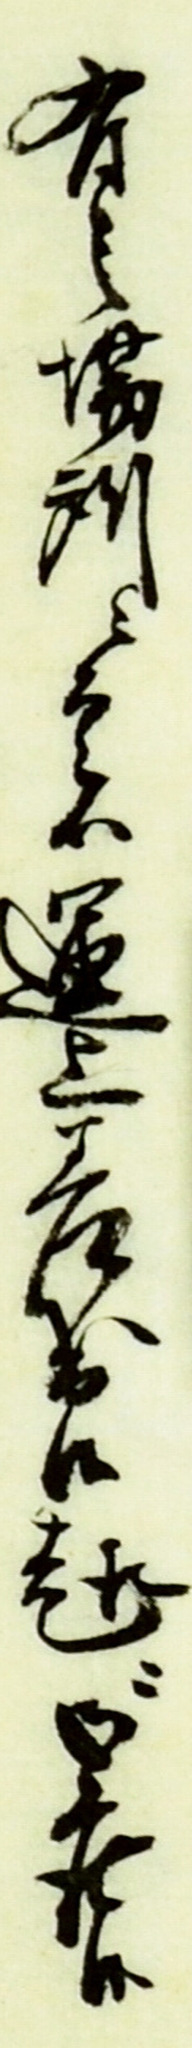有之場所ニ而者運上差出候趣ニ御座候
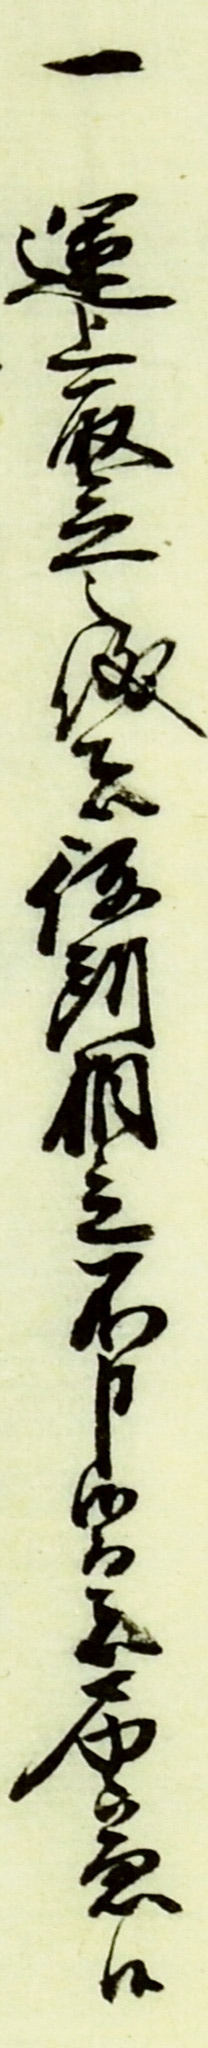一運上取立之儀者役所相立不申候而者届被兼候
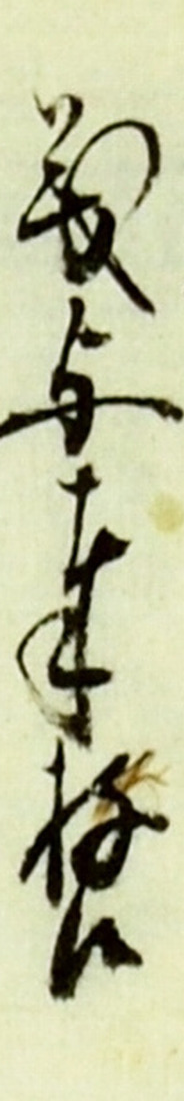義与奉存候
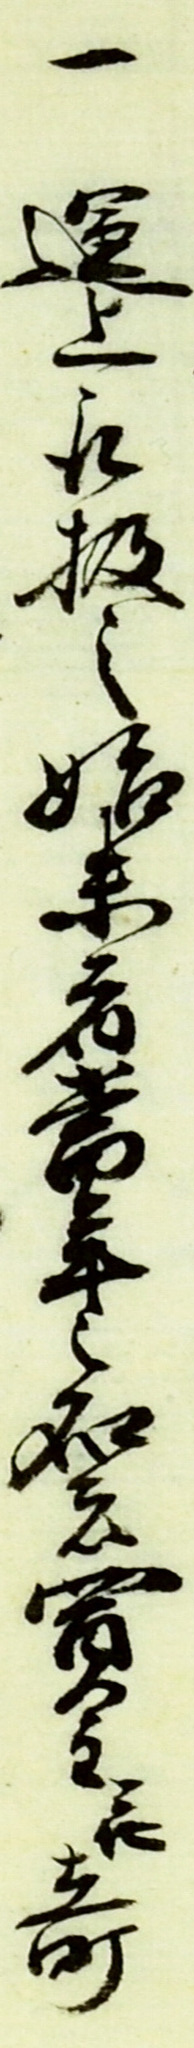一運上取扱之始末者当年之処者買主罷在町
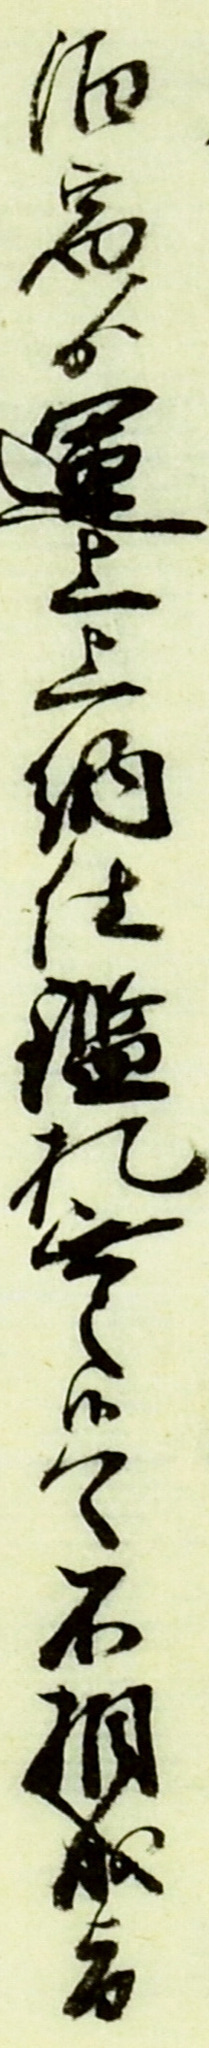泊宿ゟ運上上納仕鑑札無之候ハヽ不相成旨
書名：他国賣薬師運上之事
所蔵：伊那市立高遠町図書館・合同会社AMANE
